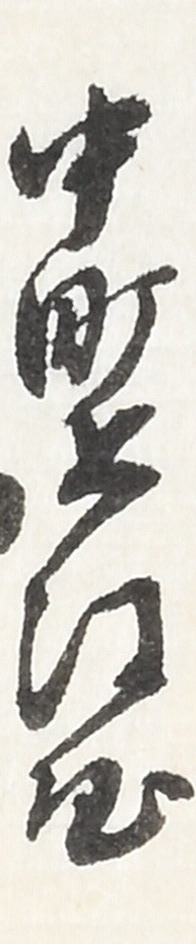中町近江屋
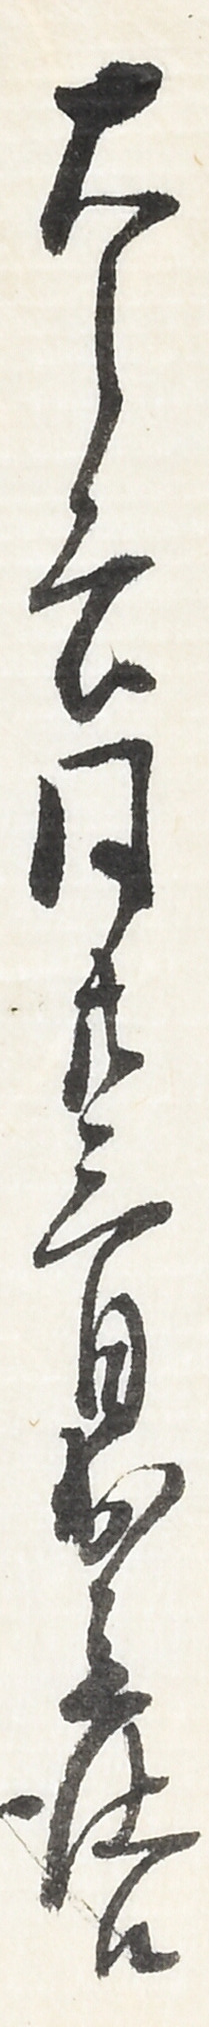右之者同廿三日出立仕候
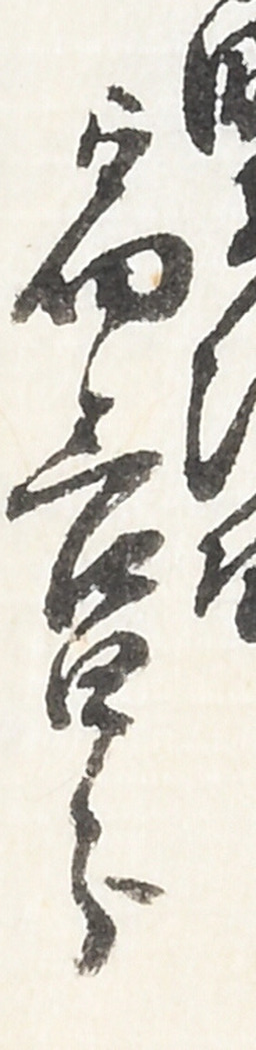宿善四郎
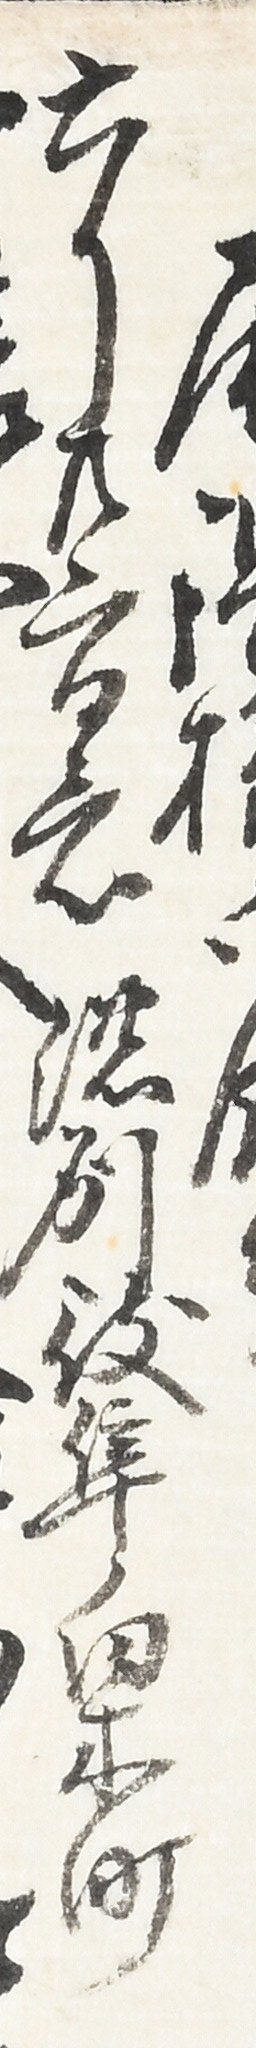六月廿二日着濃州岐隼白木町
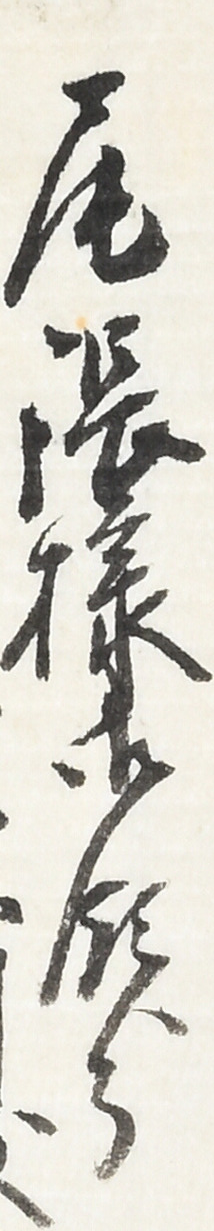尾張様御領分
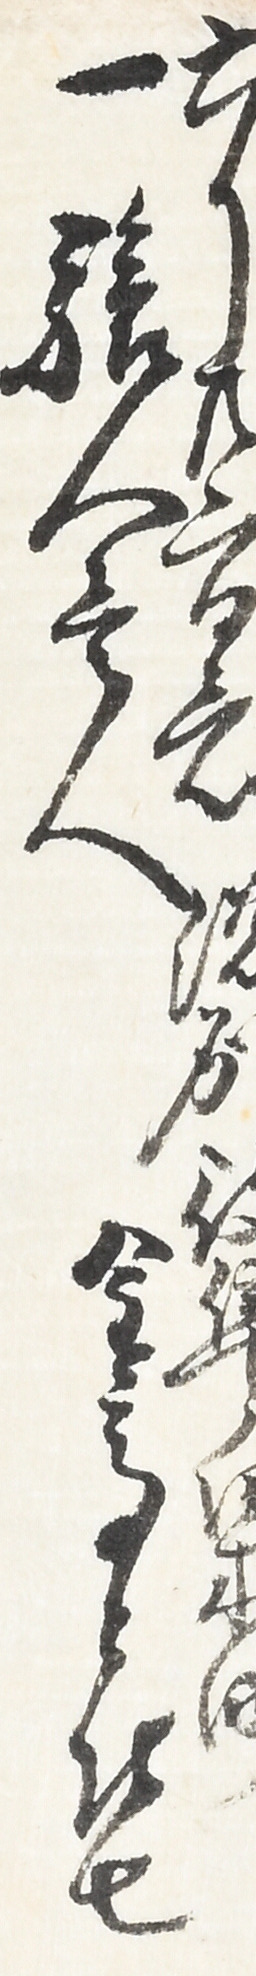一旅人壱人金高喜七
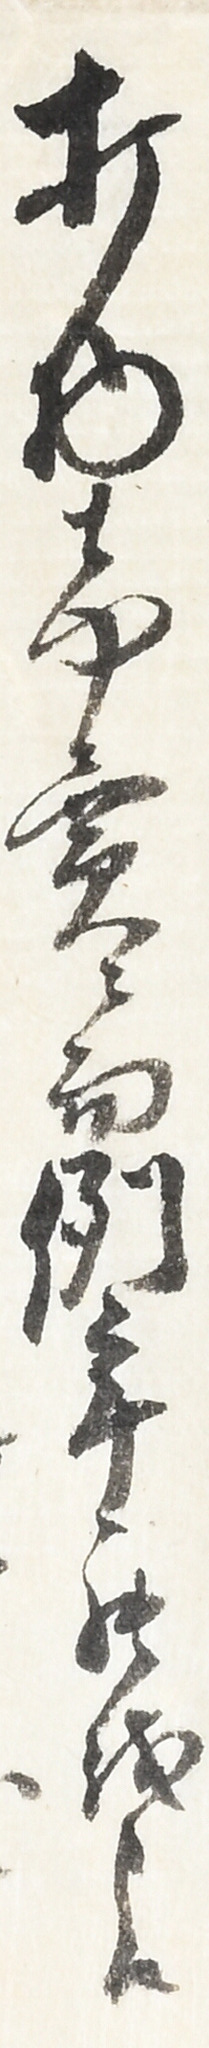打物商売ニ而例年罷越申候
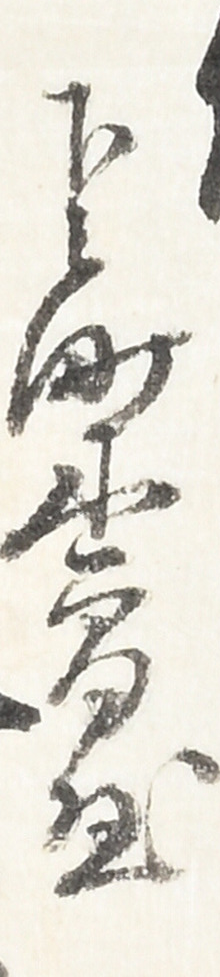下モ町木曽屋
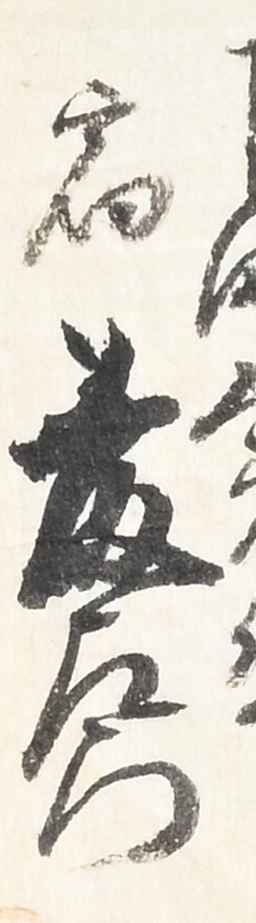宿籐左衛門

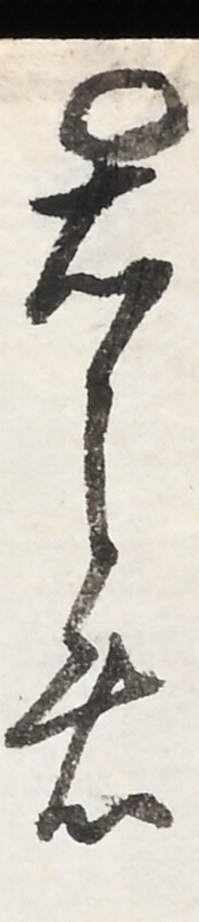〇右之者
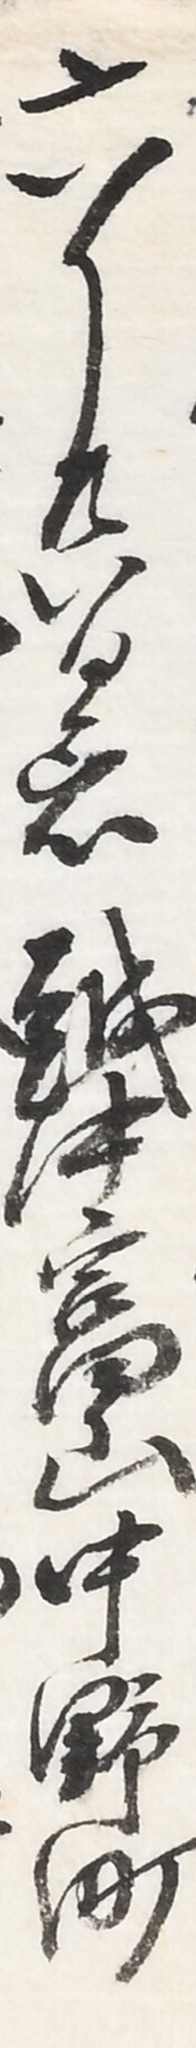六月廿八日着越中富山中野町
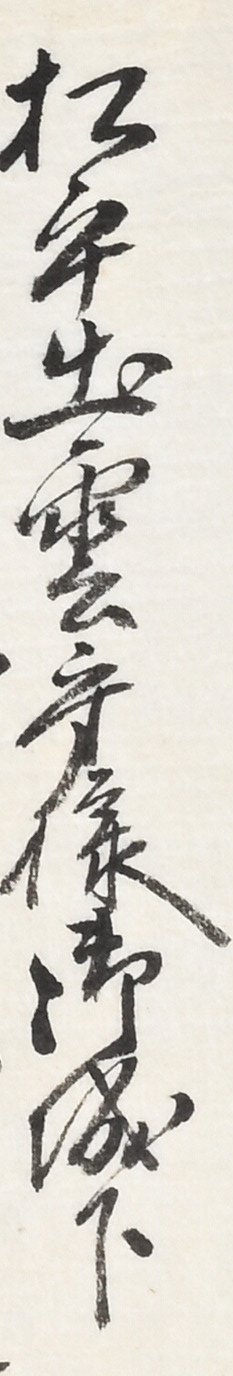松平出雲守様御城下
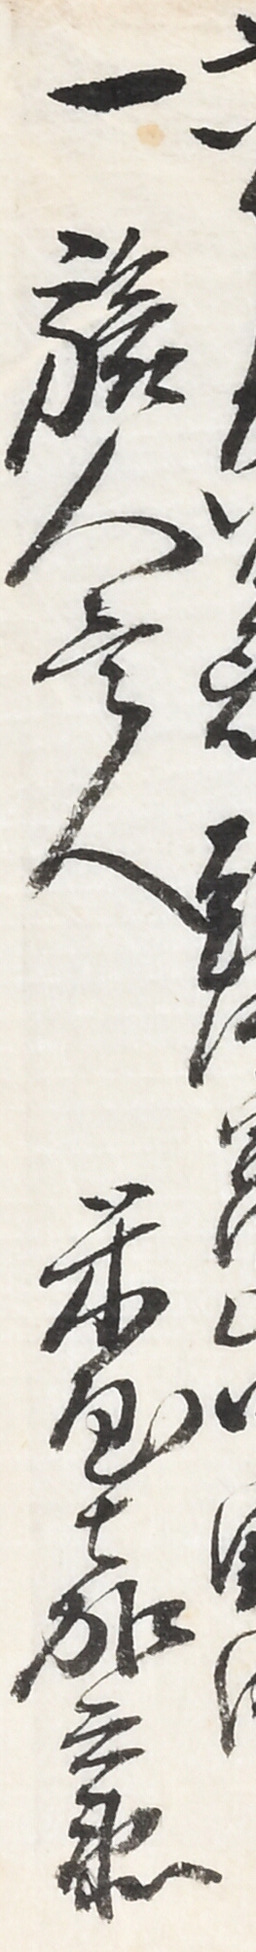一旅人壱人米屋嘉兵衛
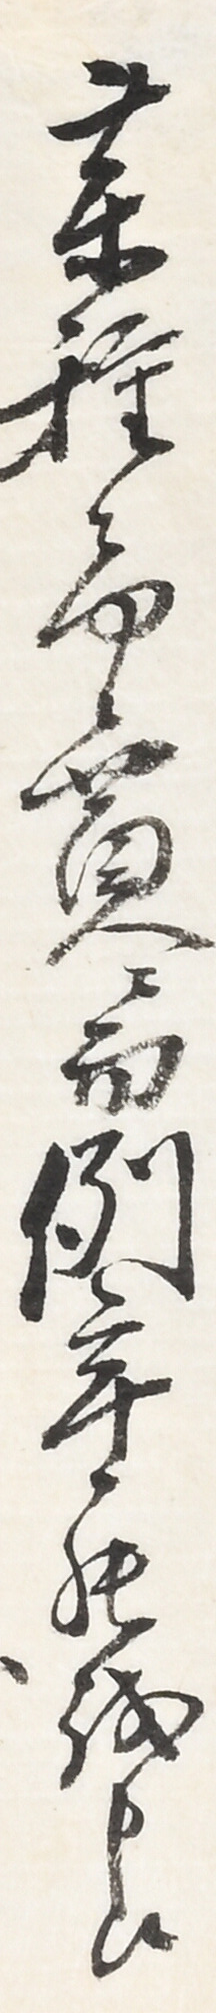薬種商売ニ而例年罷越申候
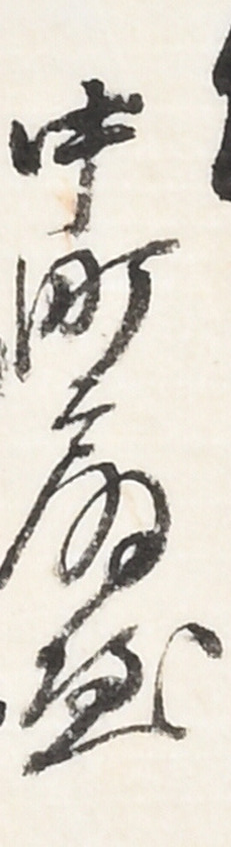中町扇屋
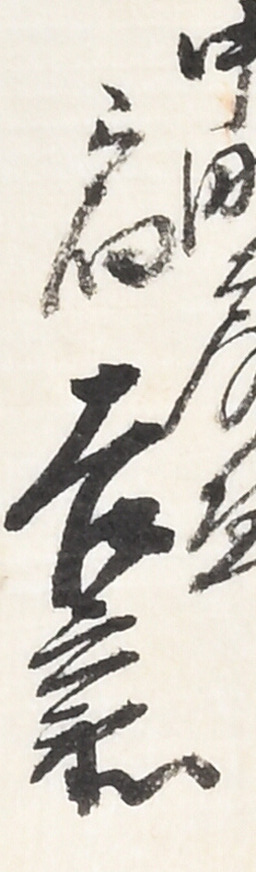宿吉兵衛
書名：旅人泊控帳
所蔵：伊那市立高遠町図書館・合同会社AMANE
